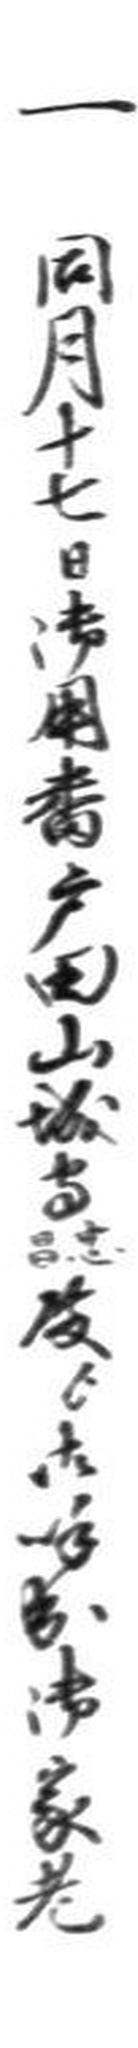一同月十七日御用番戸田山城守殿忠昌殿ゟ御呼出御家
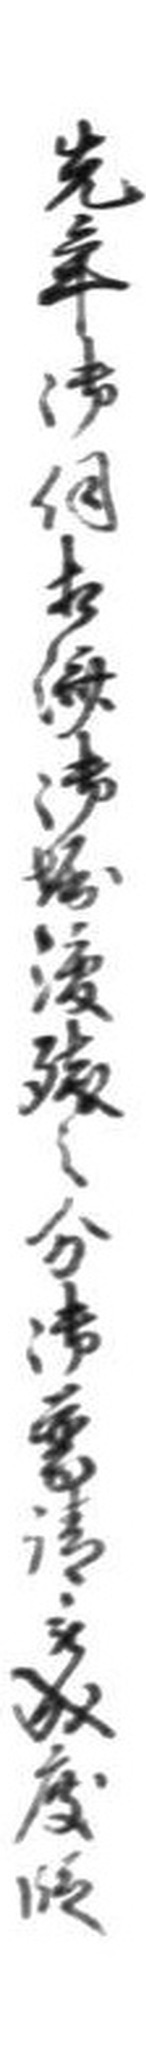先年御伺相済御堀渡残之分御普請被成度段
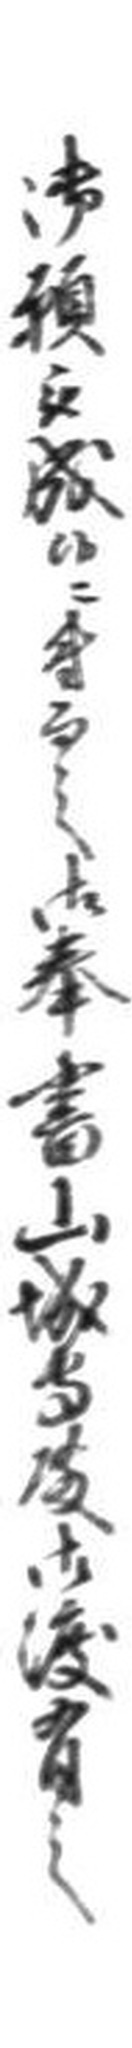御願被成候ニ付而之御奉書山城守殿御渡有之
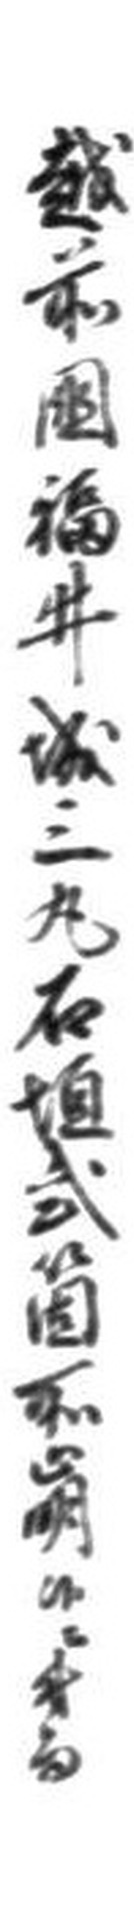越前国福井城三丸石垣弐箇所崩候ニ付而
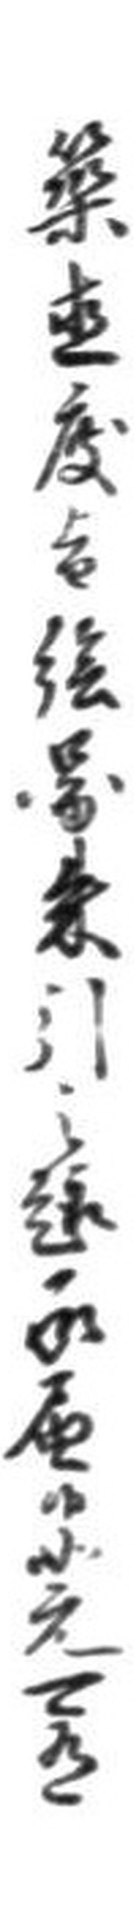築直度旨絵図朱引之趣承届候如元可有

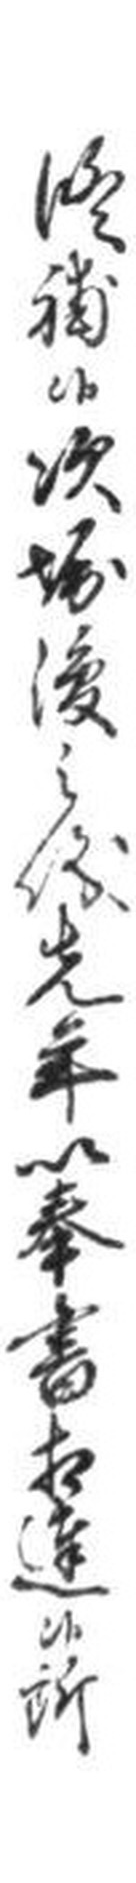修補候次堀浚之儀先年以奉書相達候所
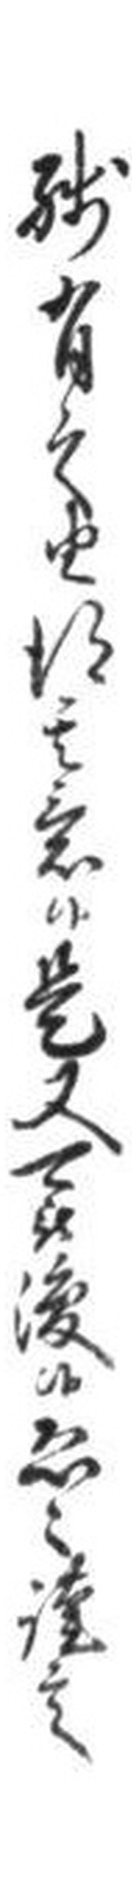残有之由得其意候是又可被浚候恐々謹言
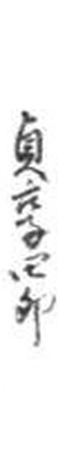貞享四卯
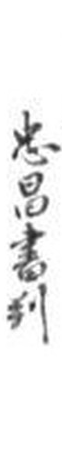忠昌書判
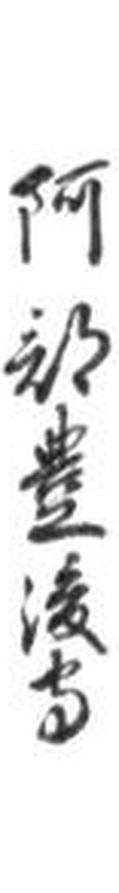阿部豊後守
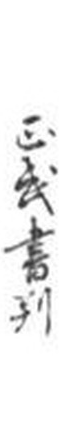正武書判
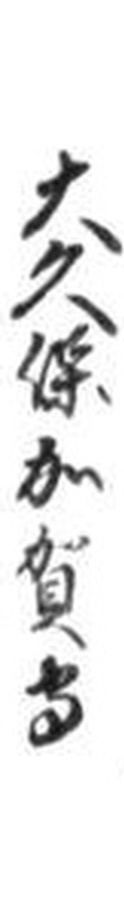大久保加賀守
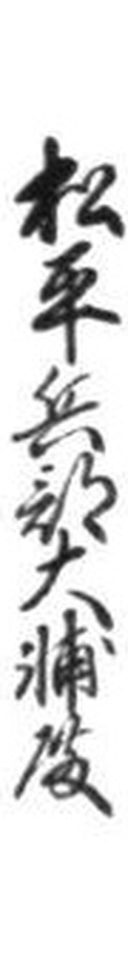松平兵部大輔殿
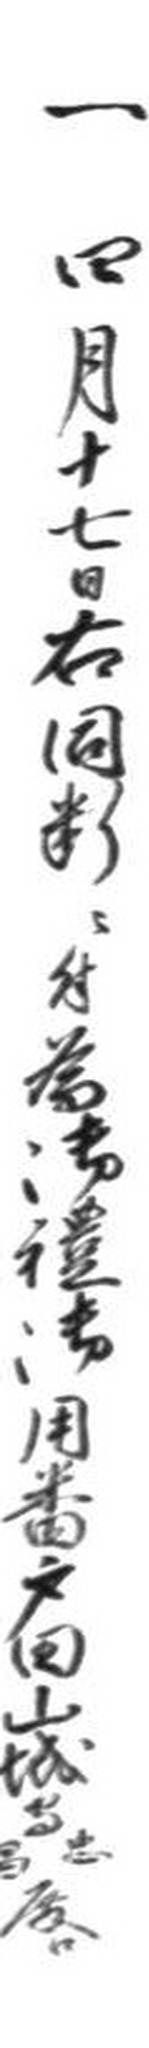一四月十七日右同断ニ付為御礼御用番戸田山城守忠昌殿江
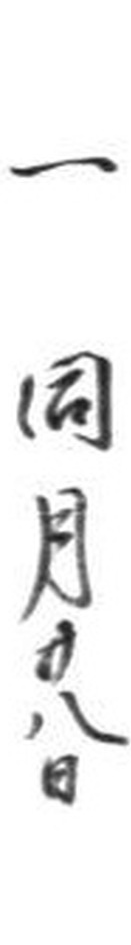一同月廿八日
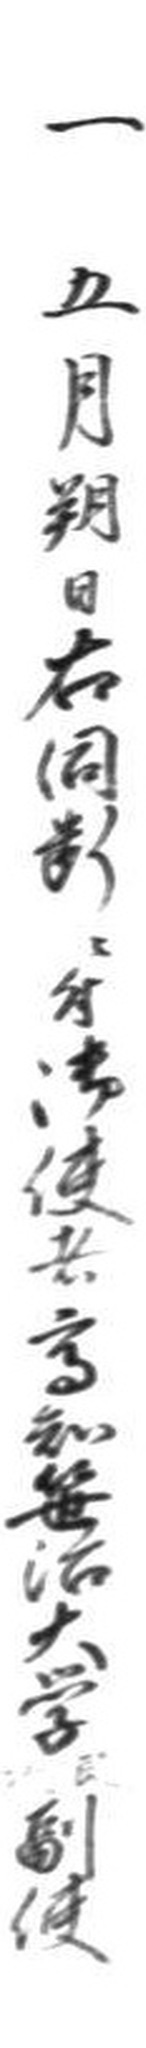一五月朔日右同断ニ付御使者高知笹治大学良次副使
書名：家譜 十六 吉品公 従貞享三年閏三月到同四年
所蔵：福井県文書館 Fukui Prefectural Archives
